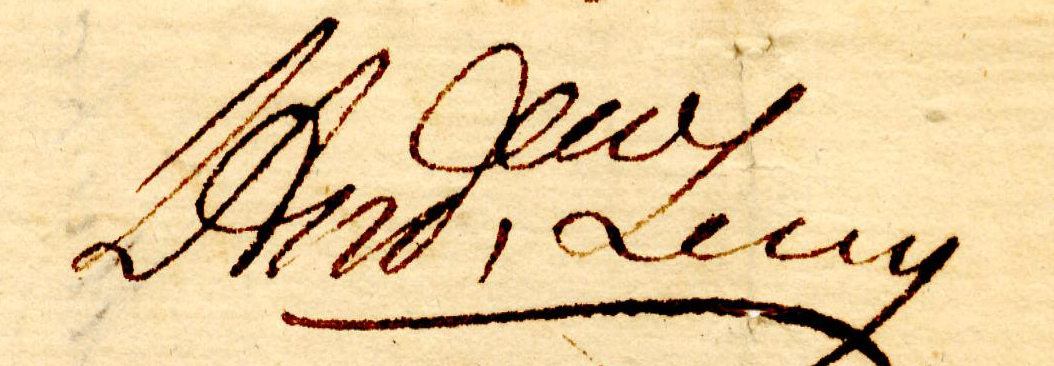And^rew Levy
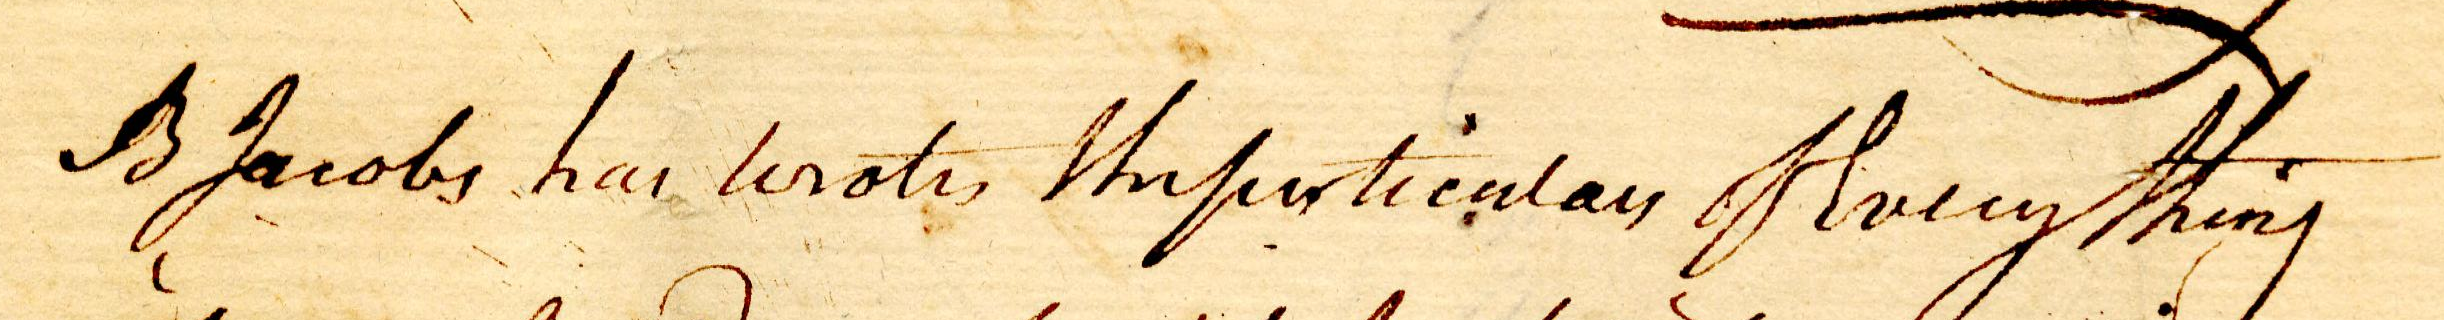Ps Jacobs has wrote the particulars of Every thing
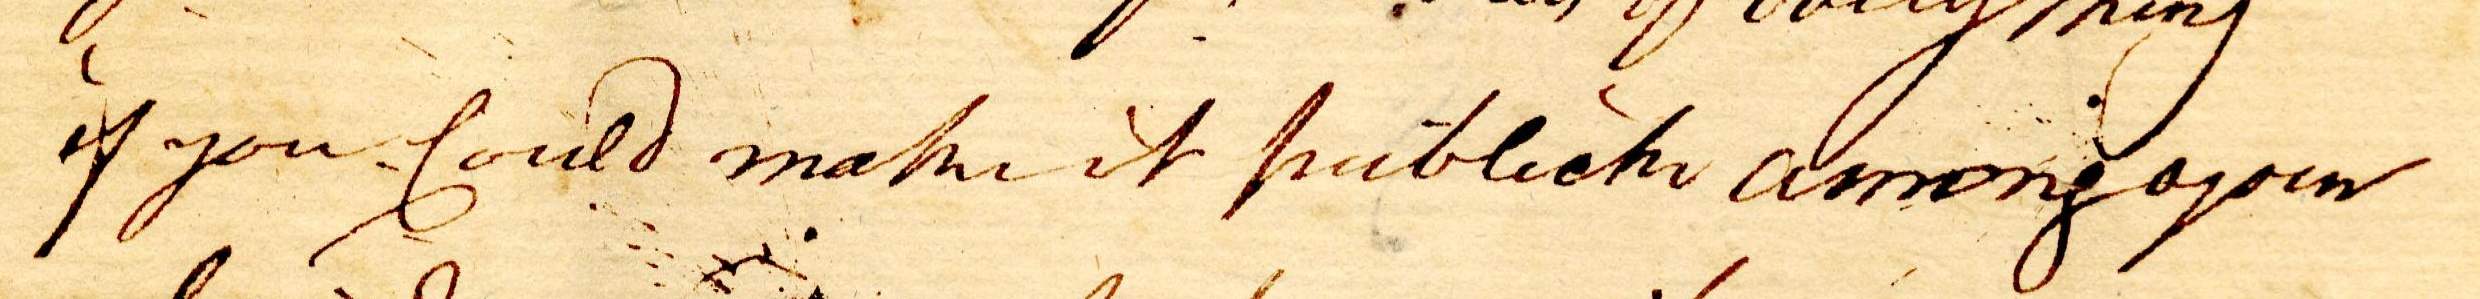if you Could make it publick among your
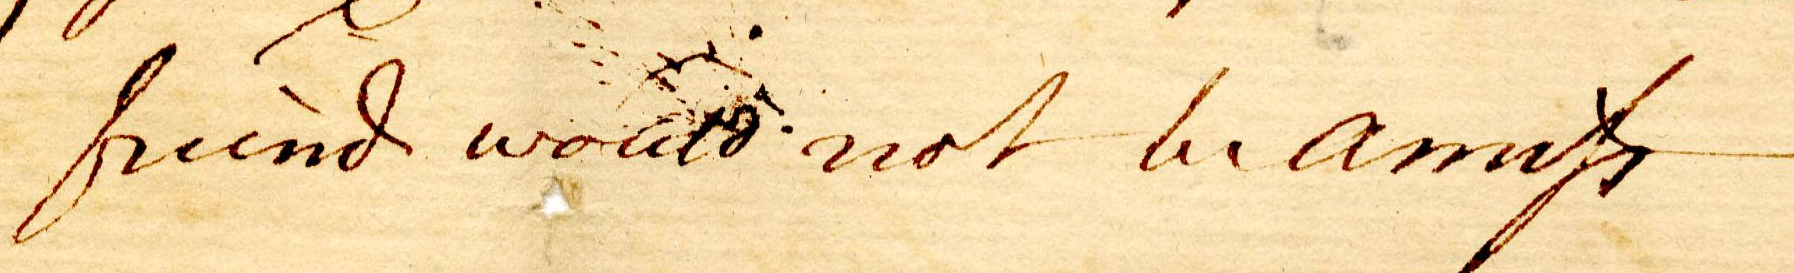friend would not be amiss
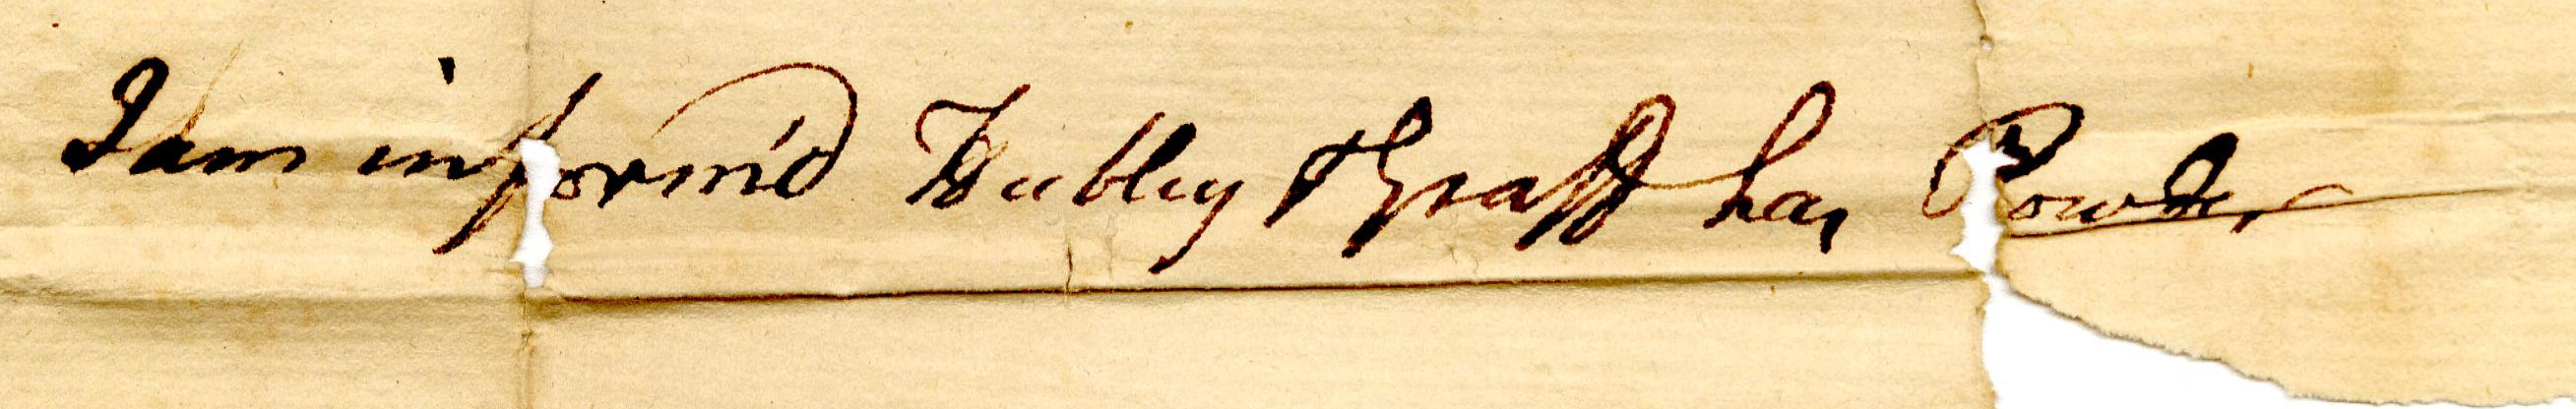I am inform'd Fabley & Graff hav Powder
